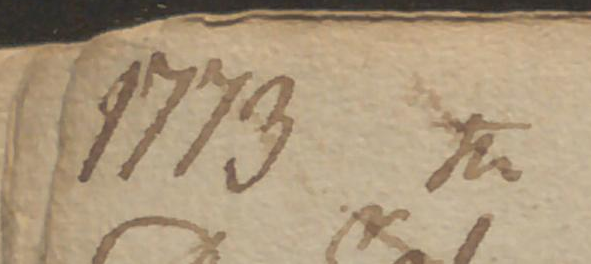1773
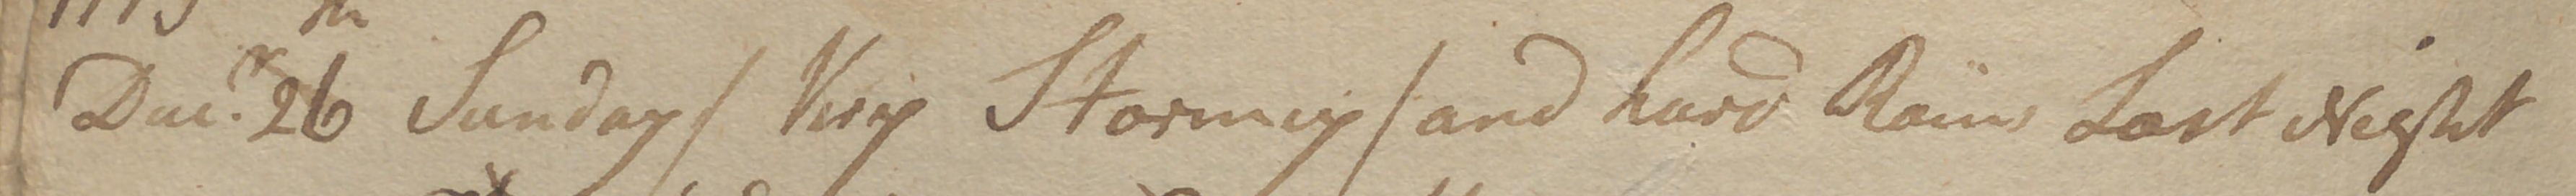Dec^r. 26^th Sunday / Very Stormy / and hard Rains Last Night
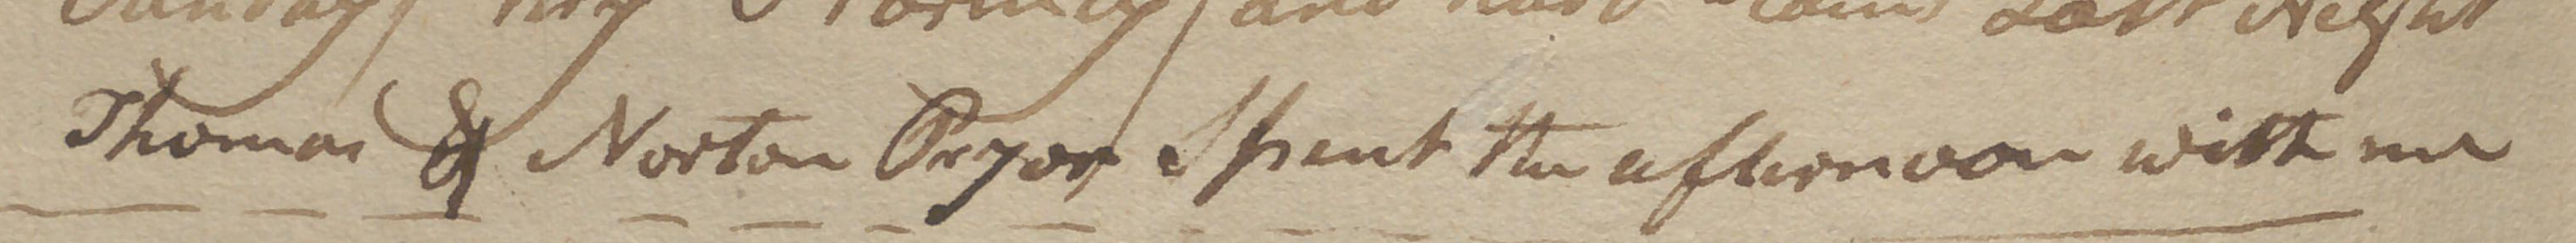Thomas & Norton Pryor spent the afternoon with me
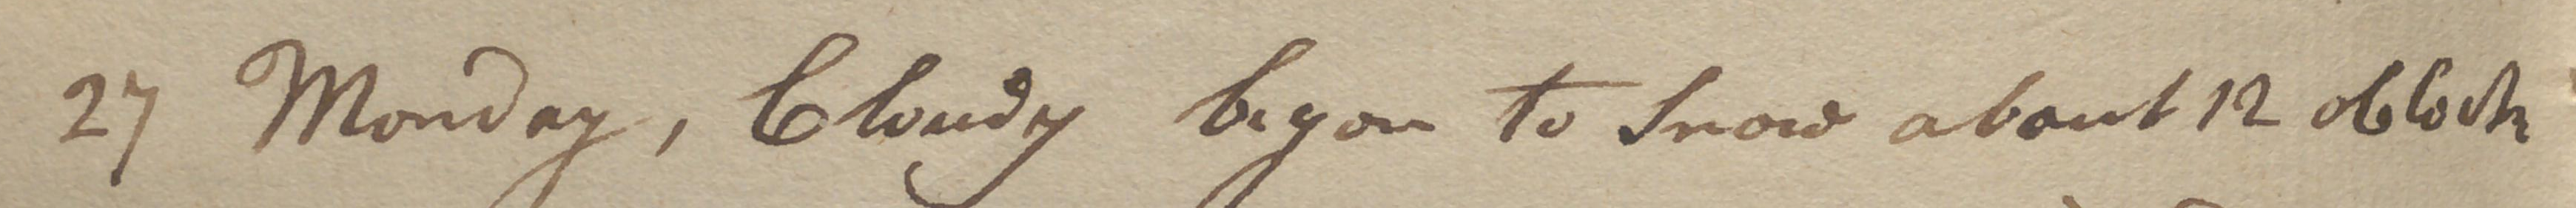27 Monday, Cloudy begon to snow about 12 oClock
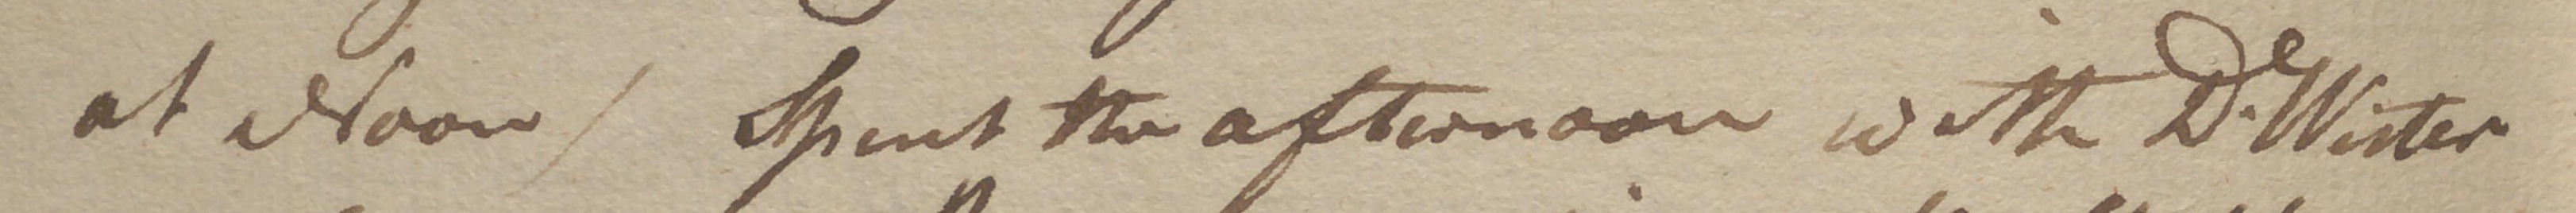at Noon / spent the afternoon with D^l. Wister
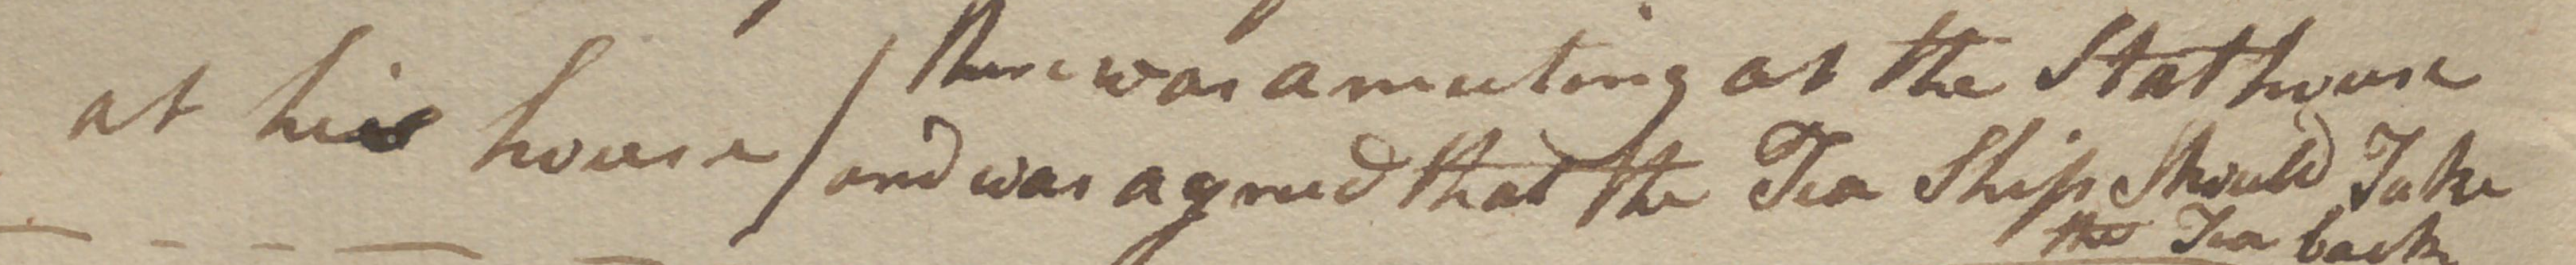at his house /and was agreed that the Tea Ship Should Take
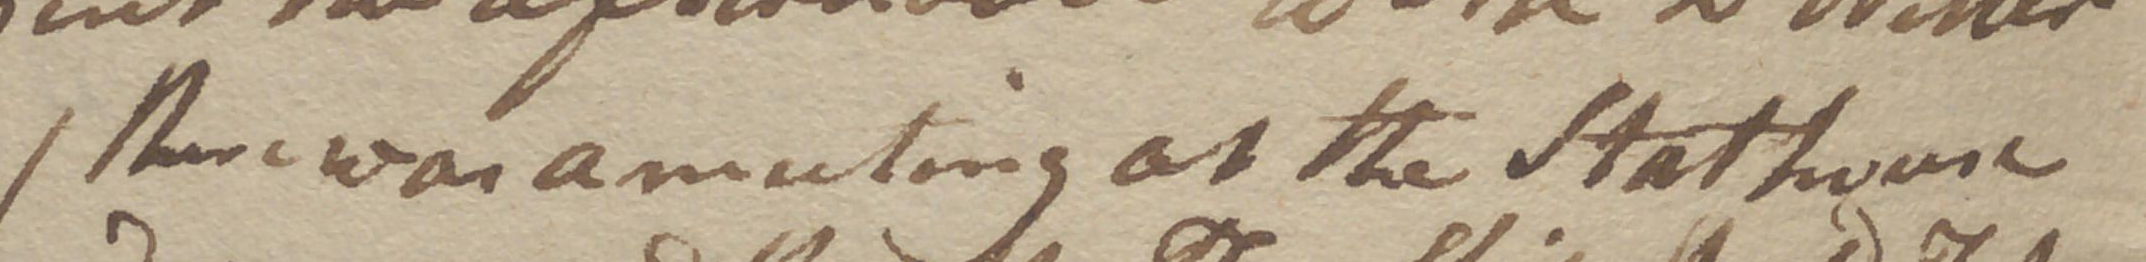there was a meeting at the Stathouse
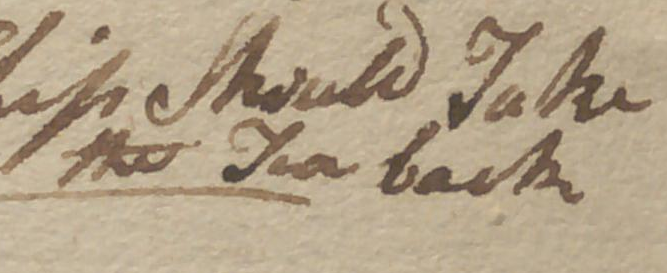the Tea back
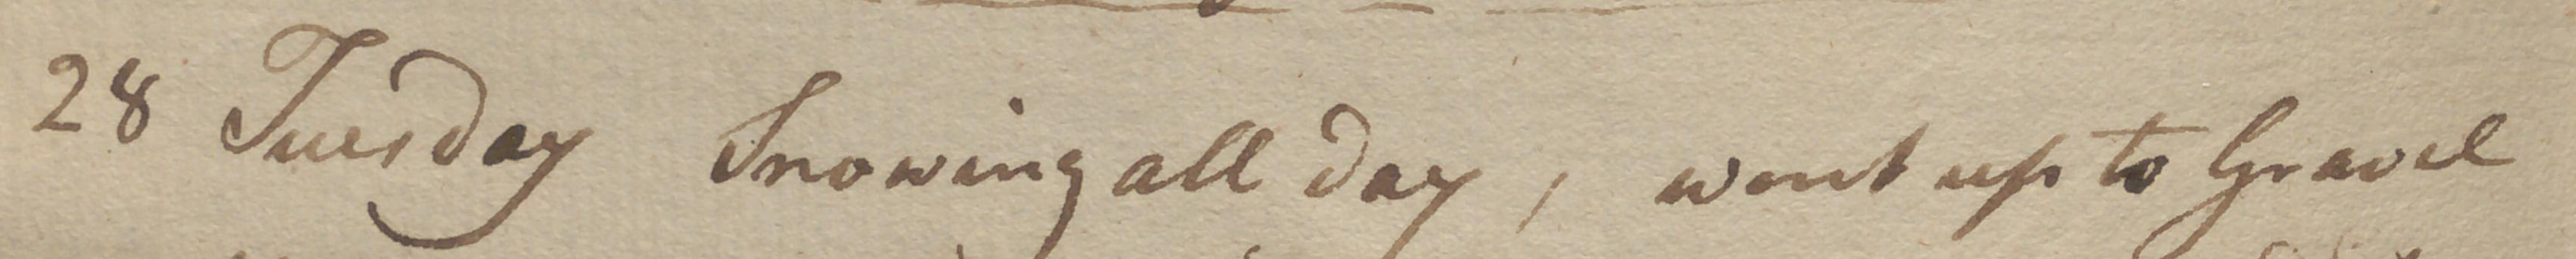28 Tuesday Snowing all day, went up to Gravel
